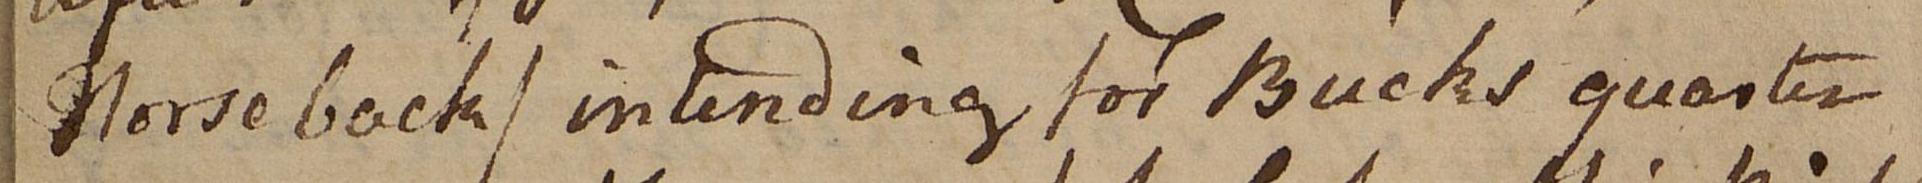Horse back/ intending for Bucks quarter
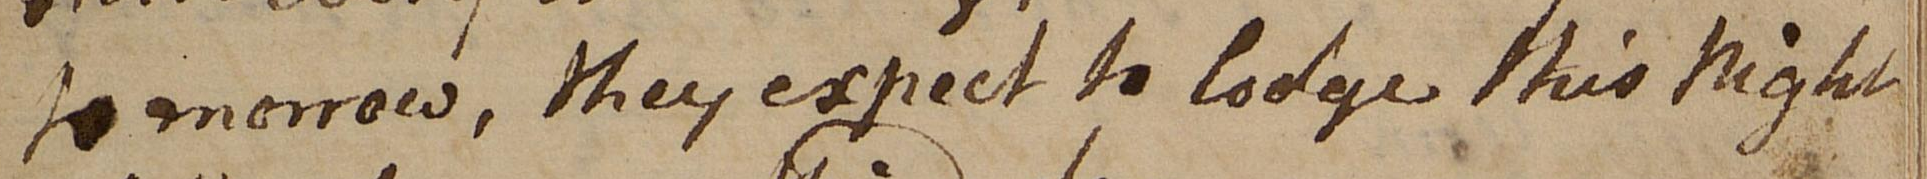to morrow, they expect to lodge this Night
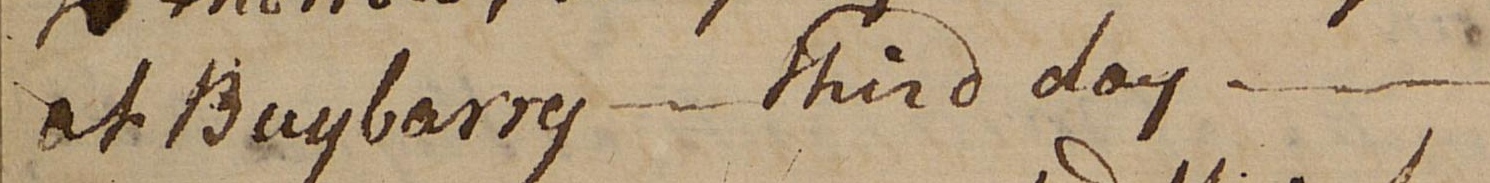at Buybarry- third day-
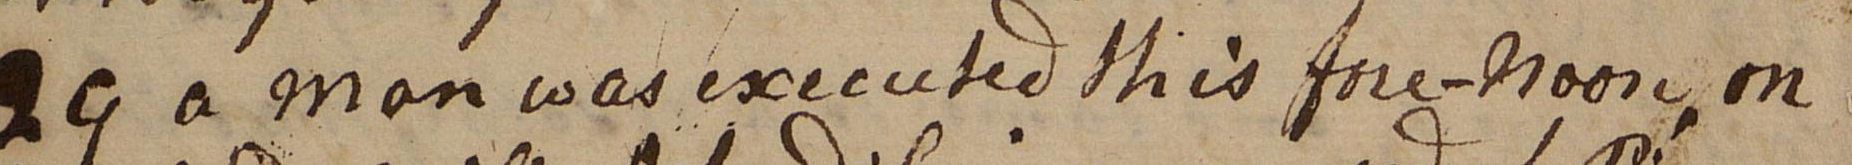29 a man was executed this fore-noon on
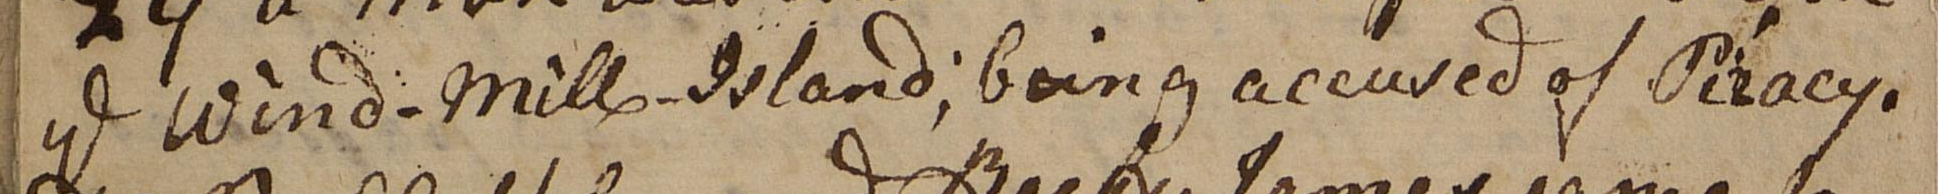y^e Wind-Mill-Island, being accused of Piracy.
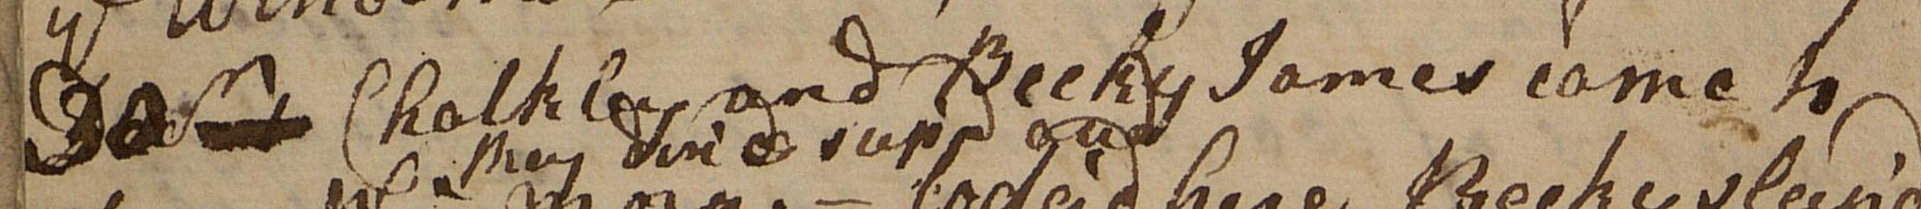De^r Chalkley and Becky James came to
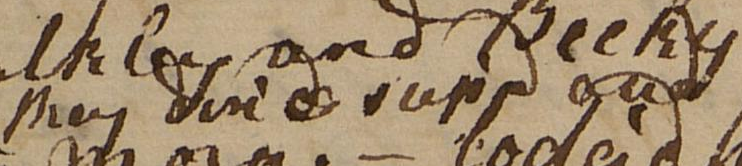they din'd sup'd and
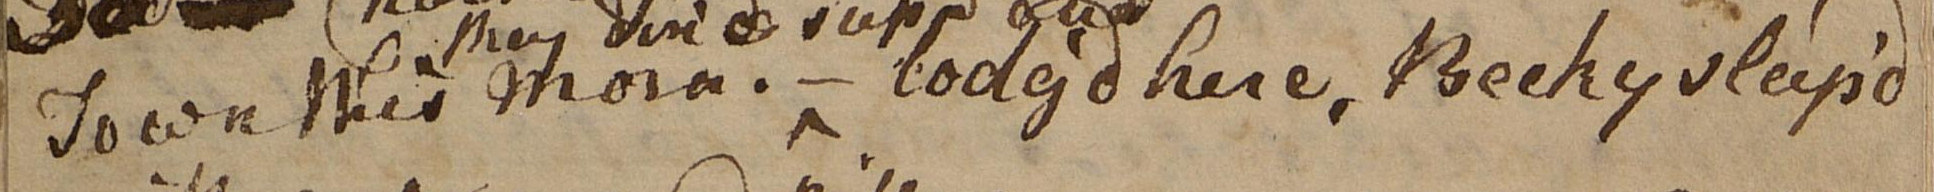Town this morn^g.- lodg'd here, Becky sleep'd
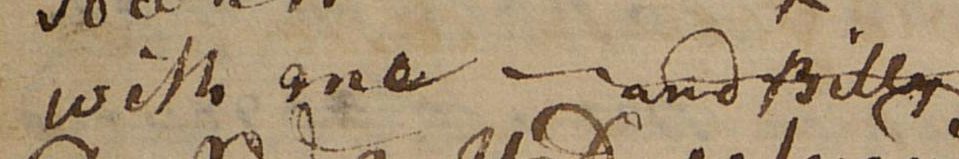with me- and Betty
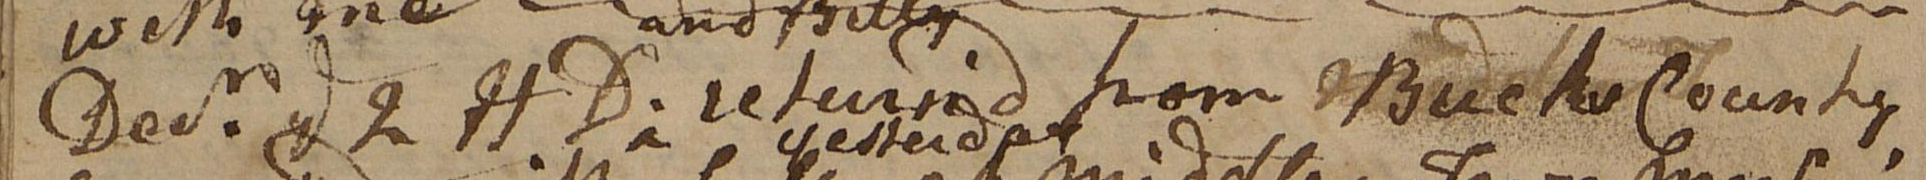Dec^r y^e 2 HD. return'd from Bucks County
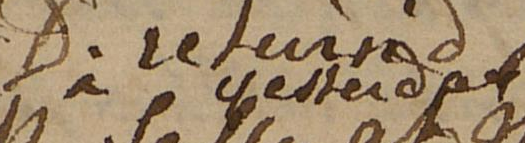a yesterday
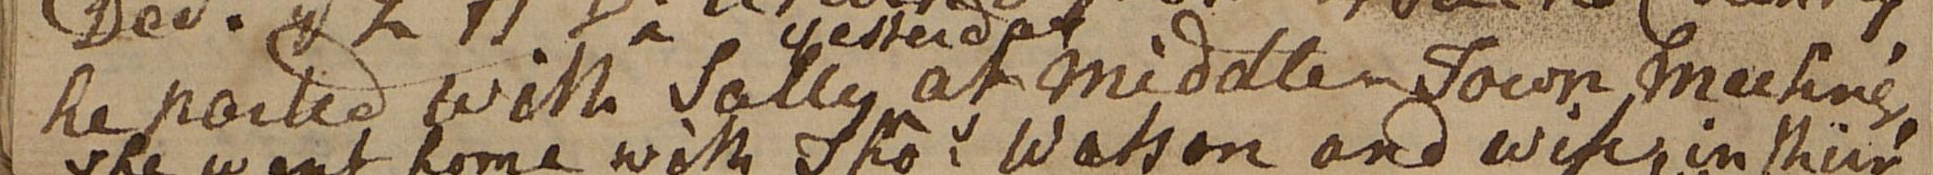he parted with Sally at Middle Town Meeting,
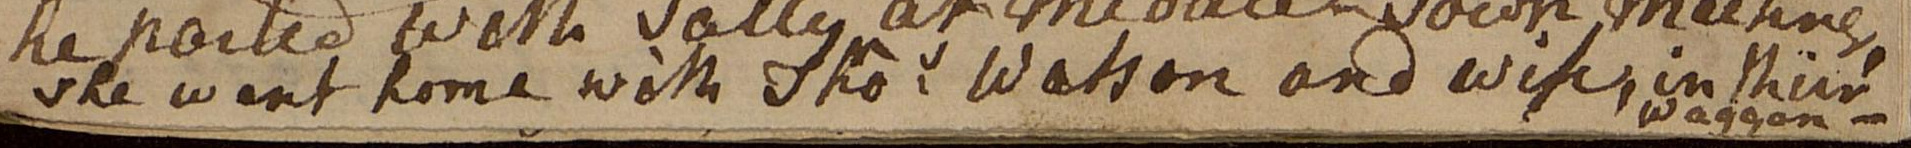she went home with Tho^s. Watson and wife, in thier
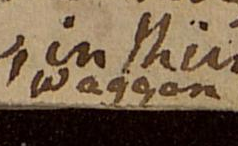Waggon-
